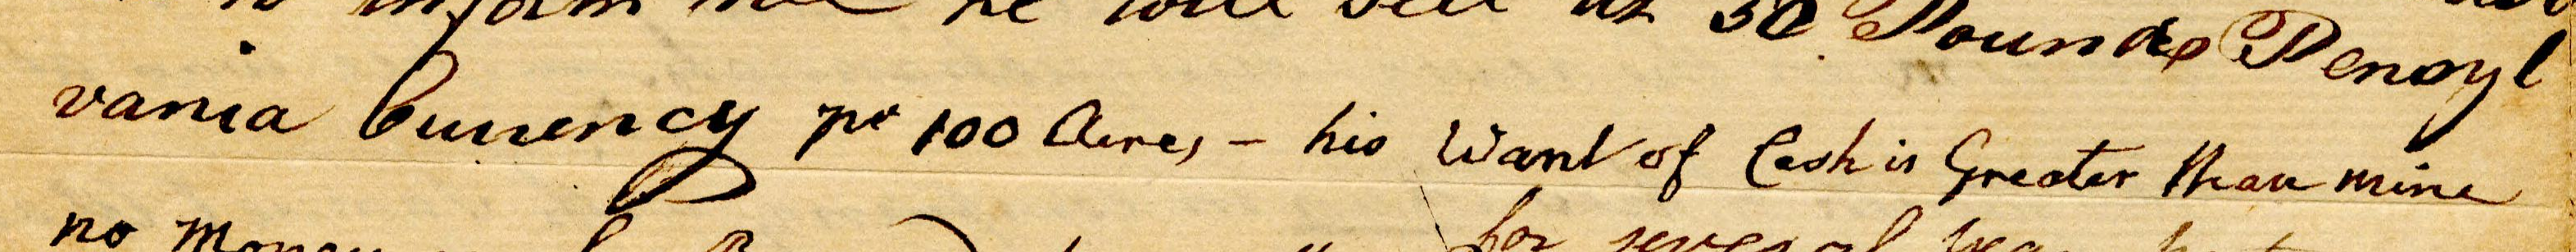vania Currency per 100 Acre,- his Want of Cash is Greater than mine
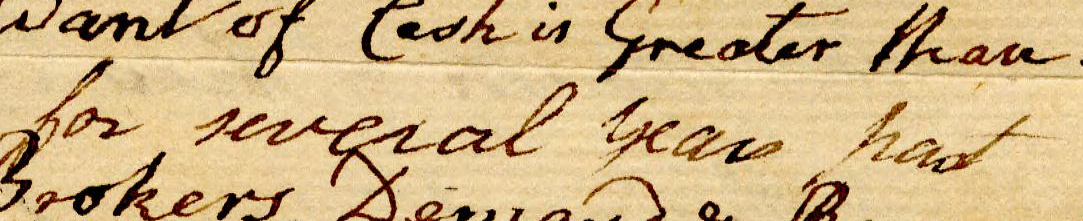for several years past
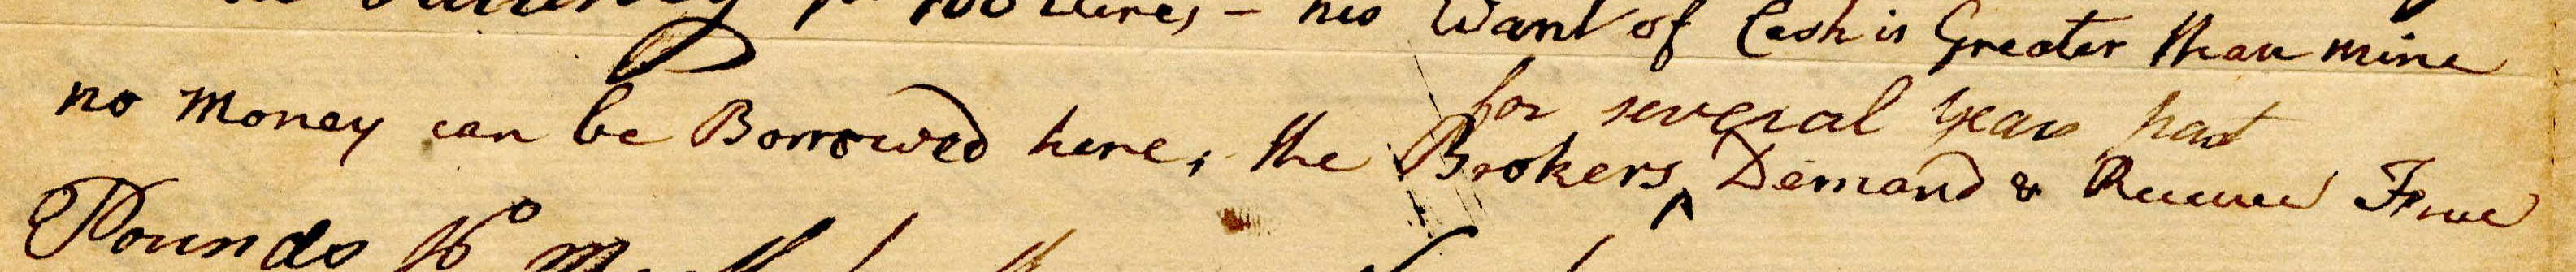no money can be Borrowed here, the Bookers ^ Demand & Receive Five
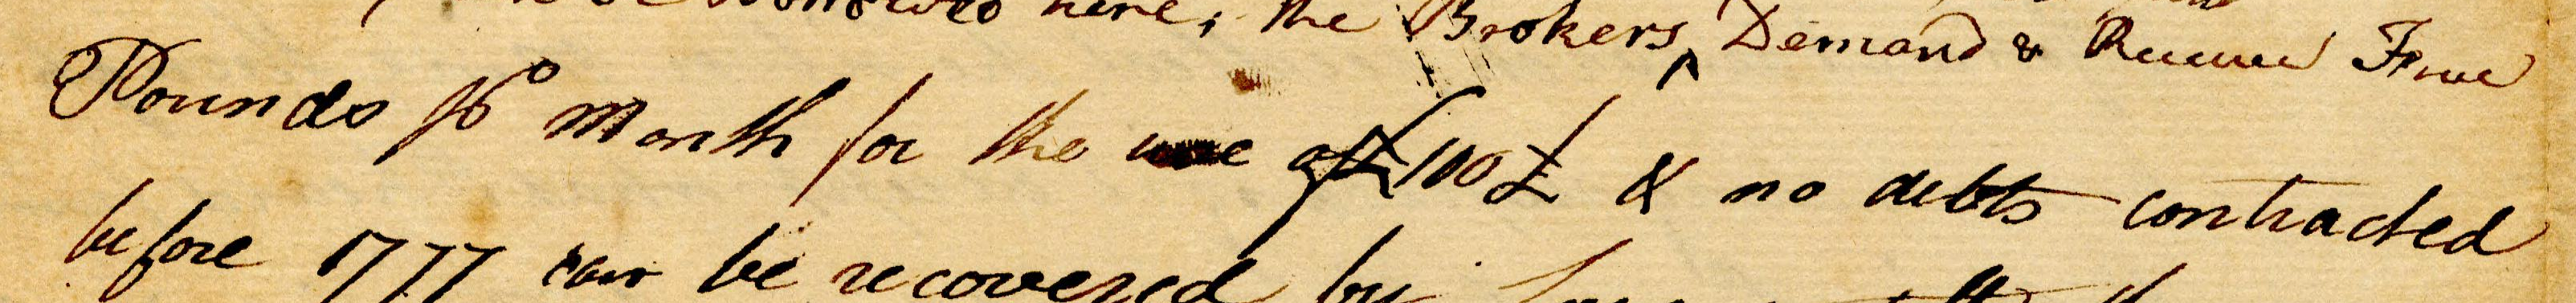Pounds per Month for the [___] [_] 100£ & no debts contracted
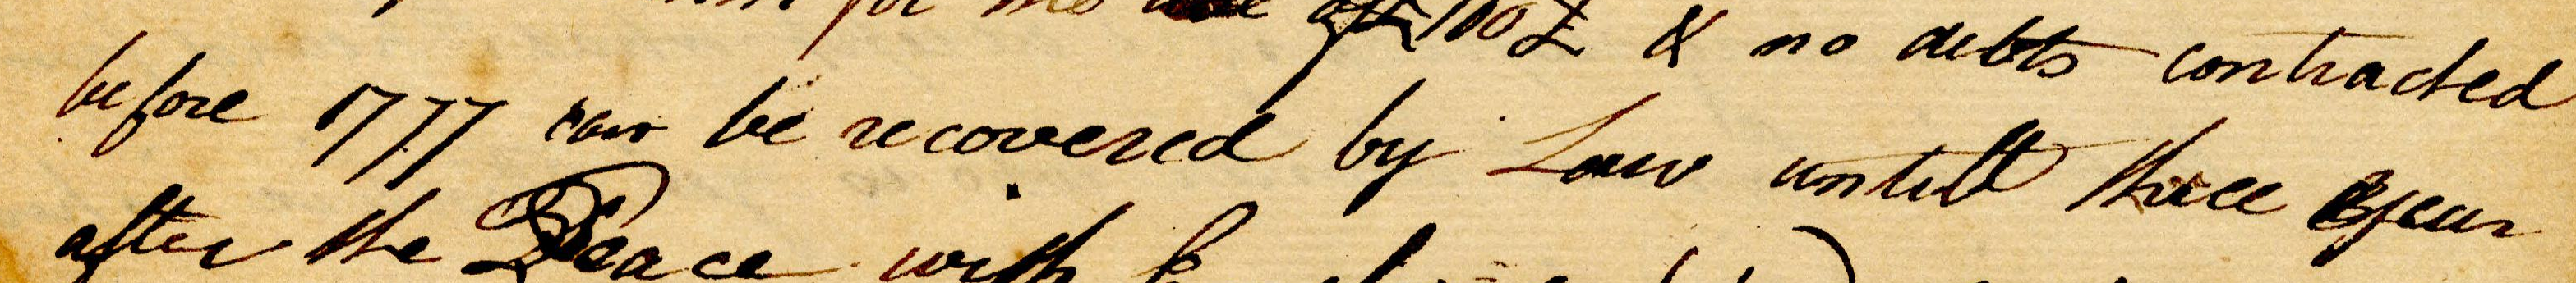before 1777 can be recovered by Law until three years
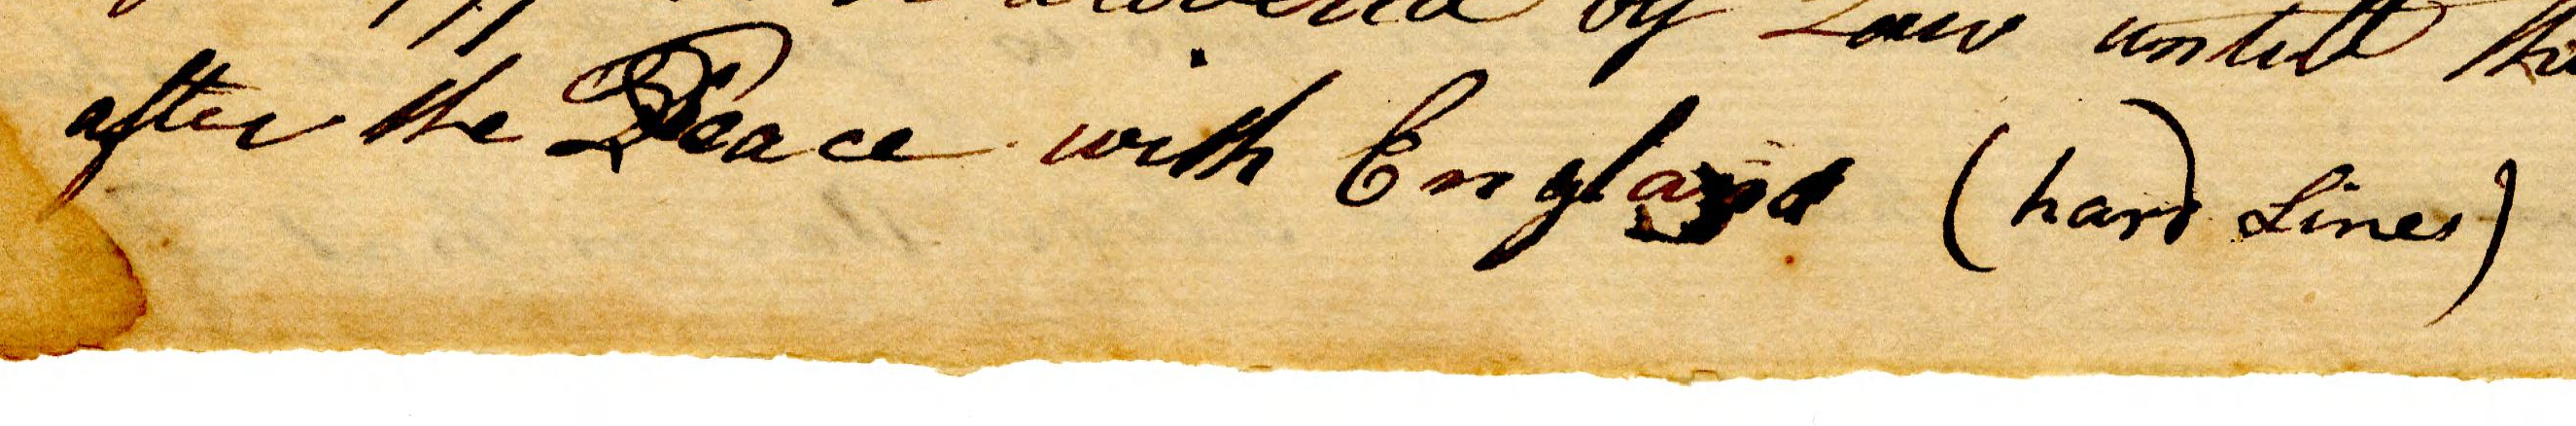after the Peace with England (hard Lines)
